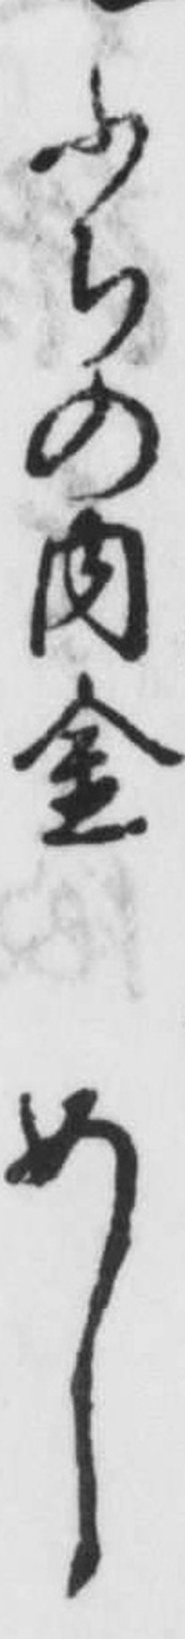ふちの金めし
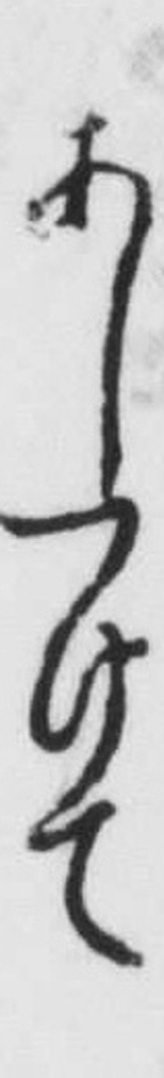あしつけて
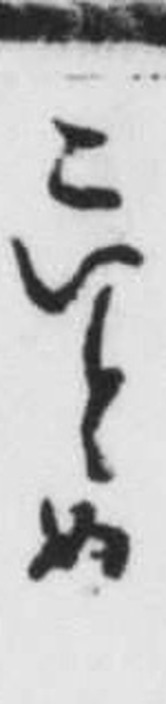こいとふ
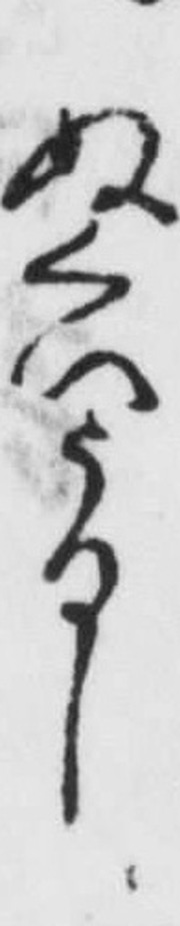ぬくいうるし
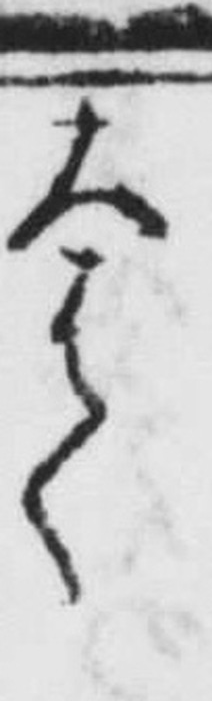大はく
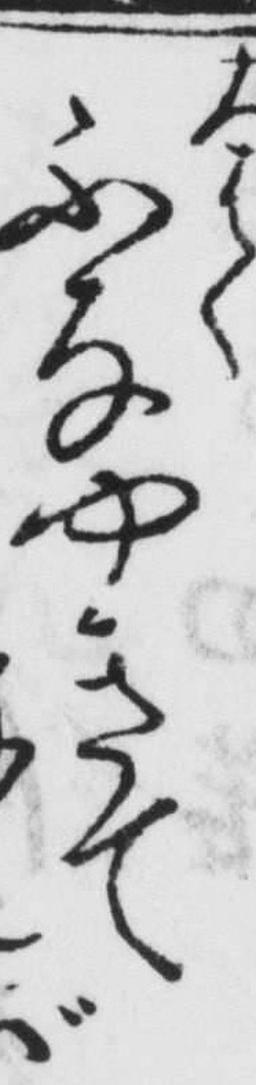ふなやきて
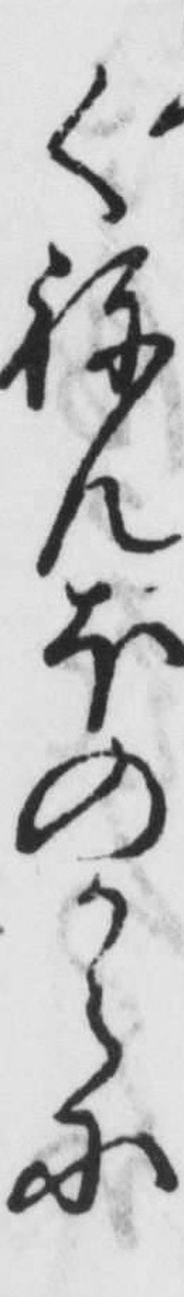くねんぼのからに

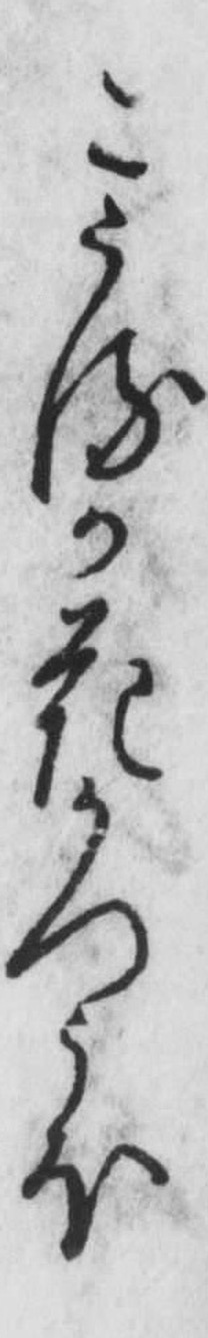こうか花かつうを
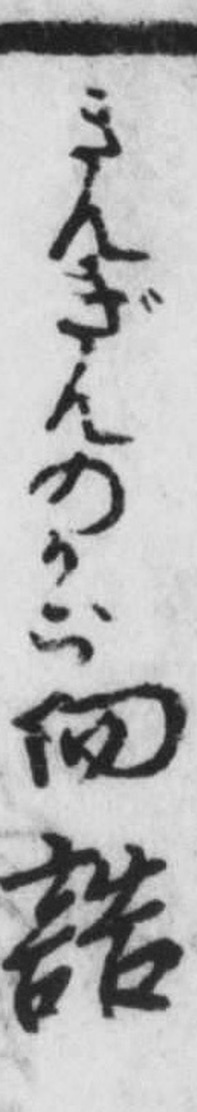きんぎんのかミ向詰
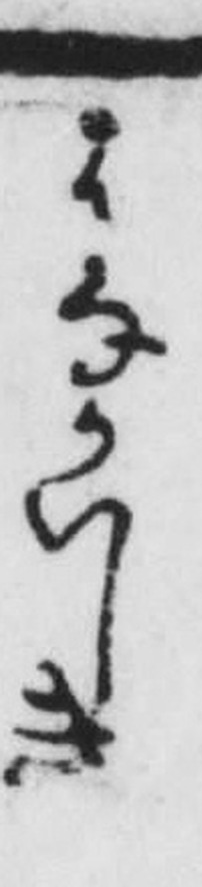はなかいしき
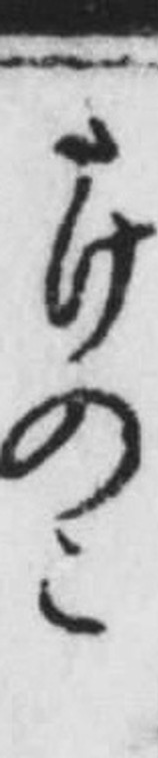たけのこ
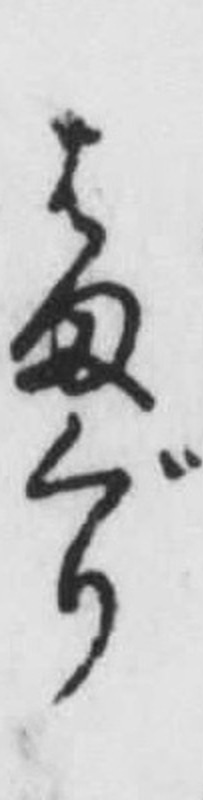はまぐり
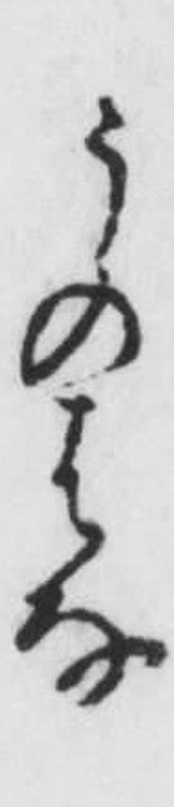うのはな
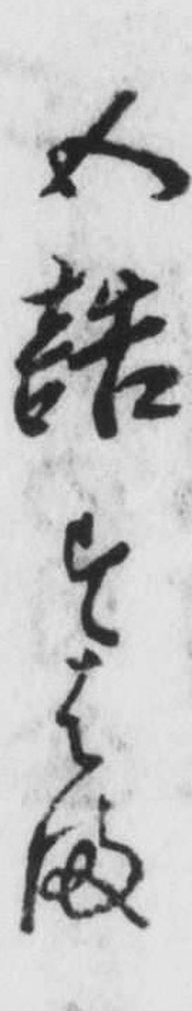五詰すはま
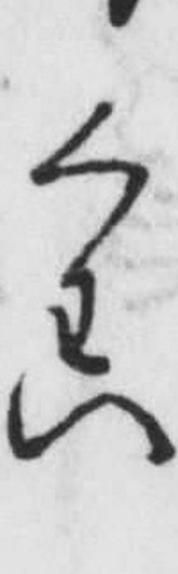くわい
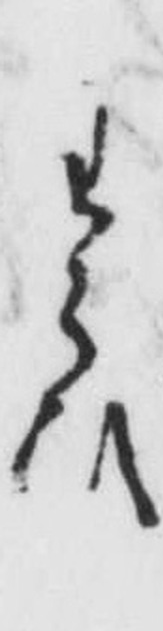わらび
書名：料理切形秘伝抄
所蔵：大阪府立大学学術情報センター 国文学研究資料館
